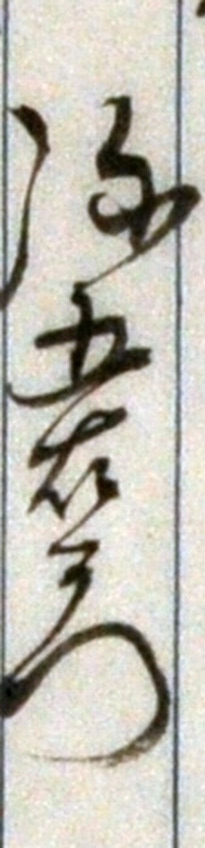弥五右衛門
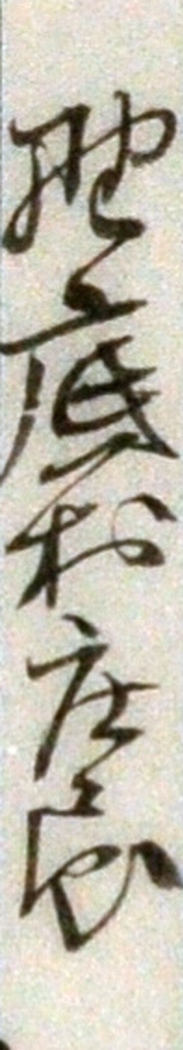野底村庄屋
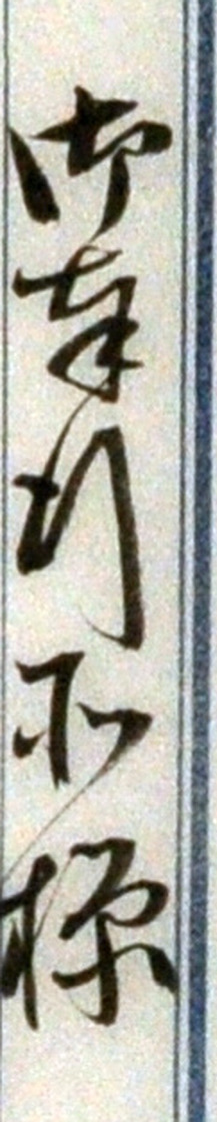御奉行所様
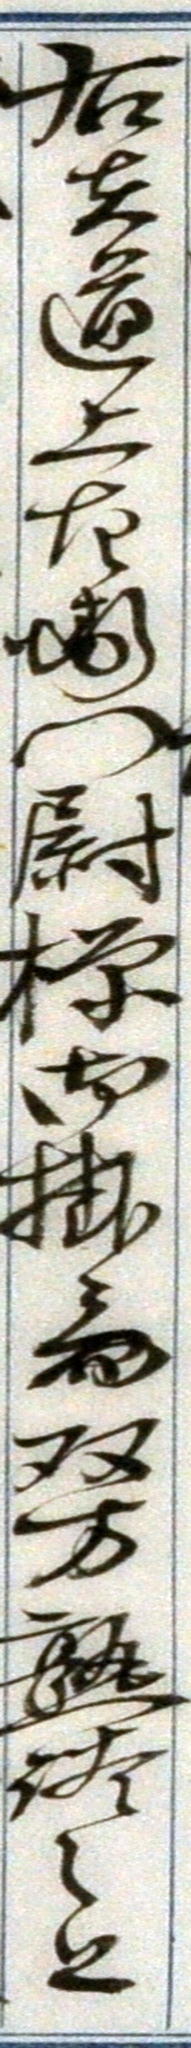右者道上左衛門尉様御掛ニ而双方熟読之上
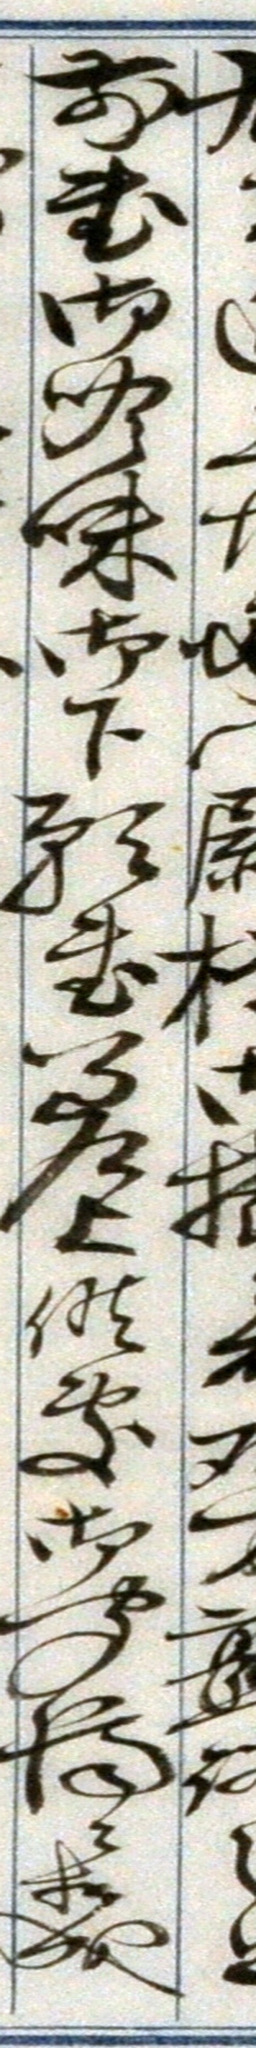前置御吟味御下願置差上候處御聞済ニ相成
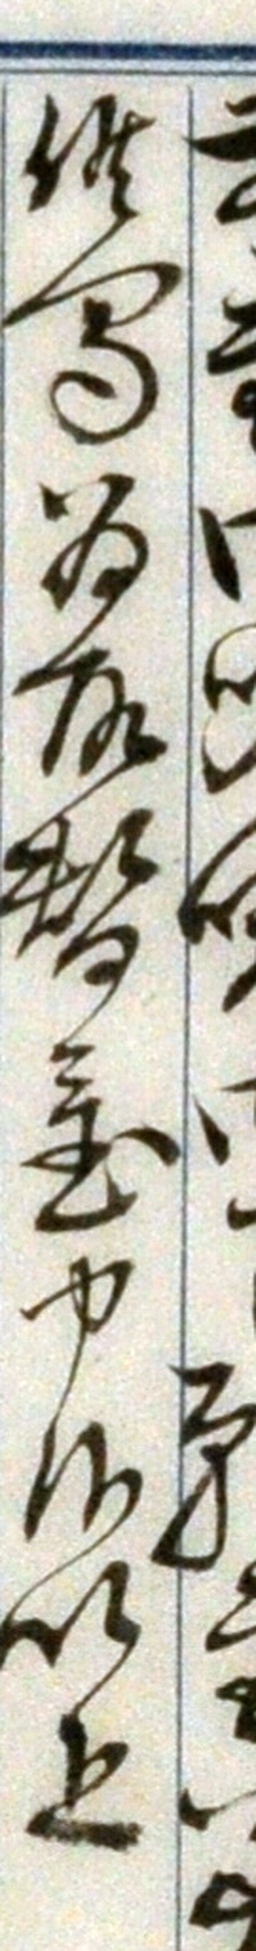候写為取替置申候以上

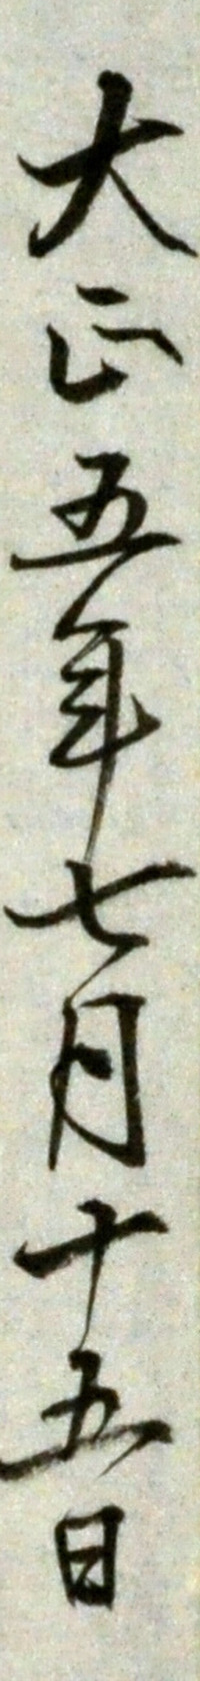大正五年七月十五日
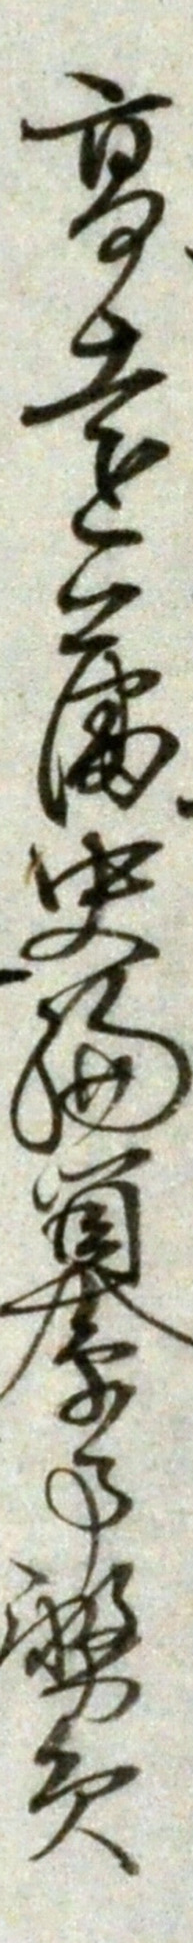高遠藩史編纂事務員
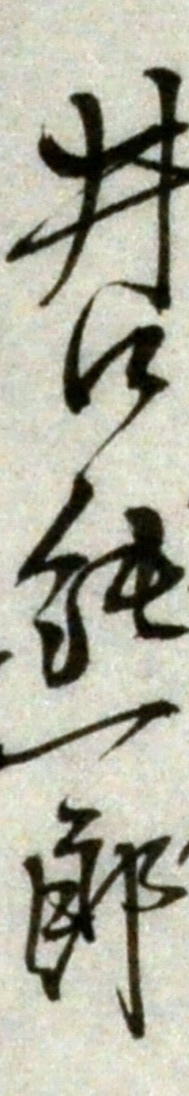井口純一郎
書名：天竜川通船難渋願并取極書
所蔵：伊那市立高遠町図書館・合同会社AMANE
